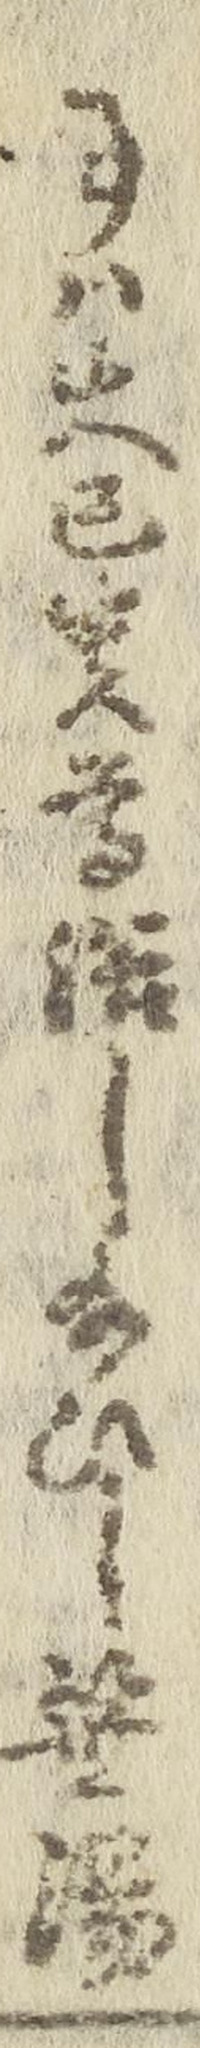事は大巳貴尊浴し給ひし笹湯
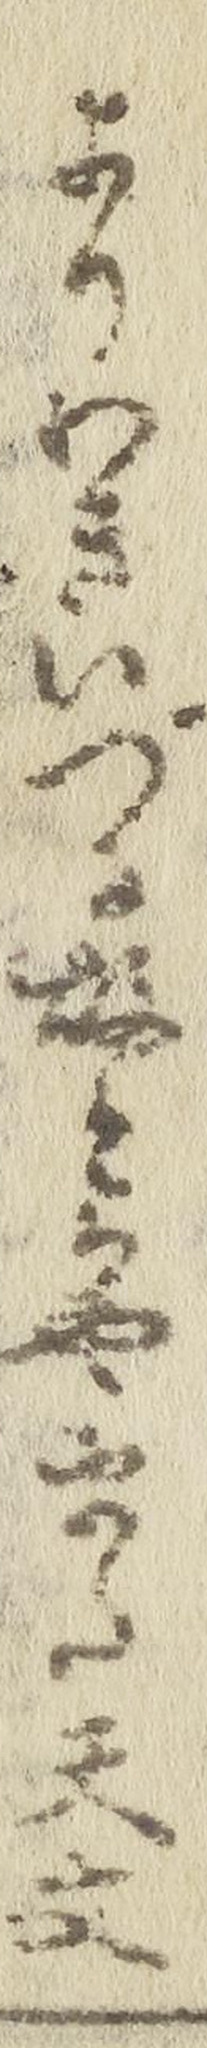よりわきいづる故とかやまた天文
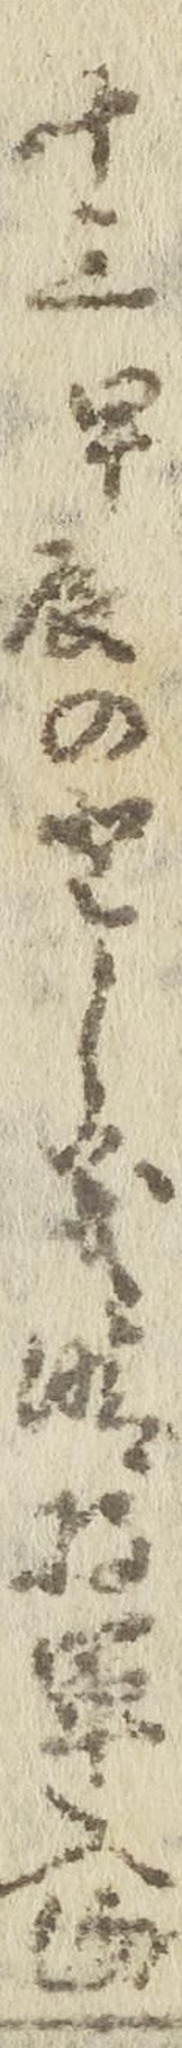十三甲辰のとし義晴将軍入湯
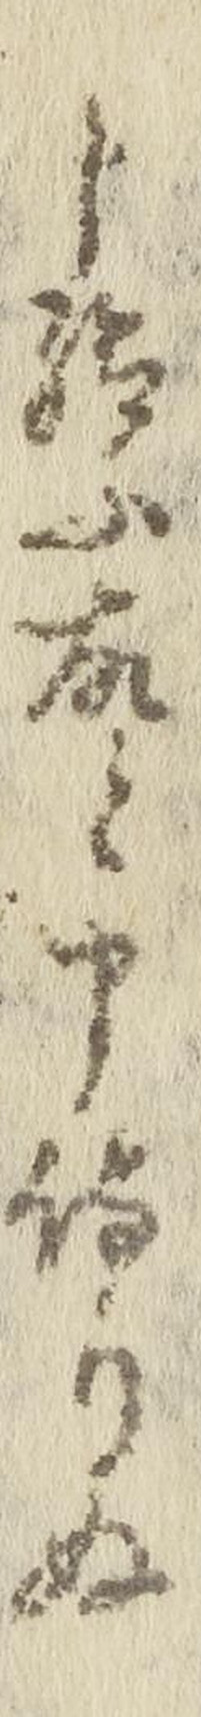し給ふ故と申侍りぬ
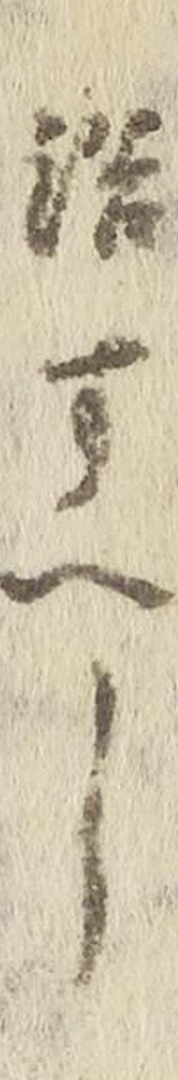浴すへし
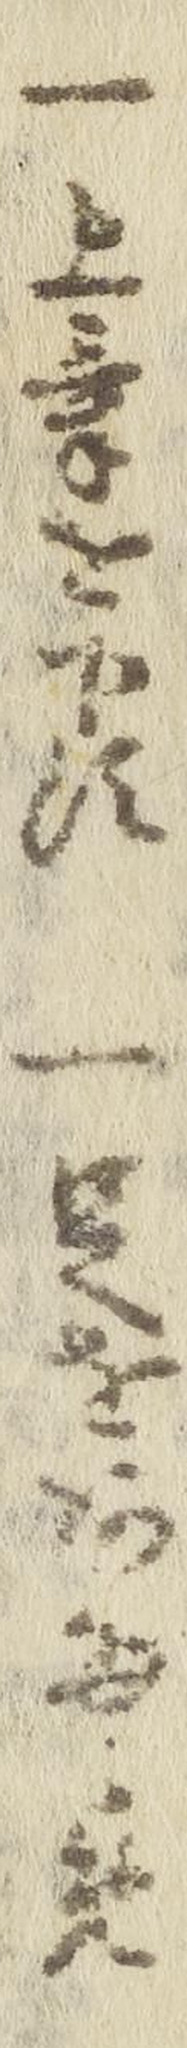一上気を下す一足をあたゝめ
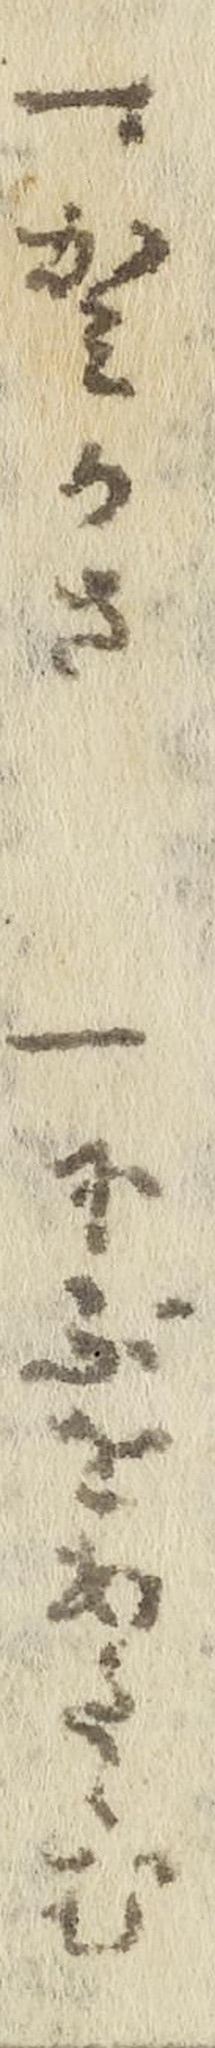一かみかさ一下ぶをあたゝむ
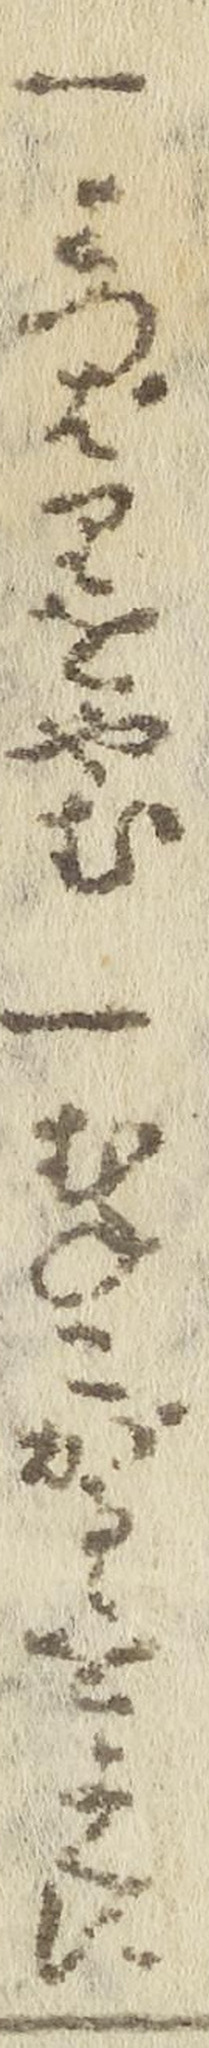一よつばりをやむ一むねこがるゝよくす
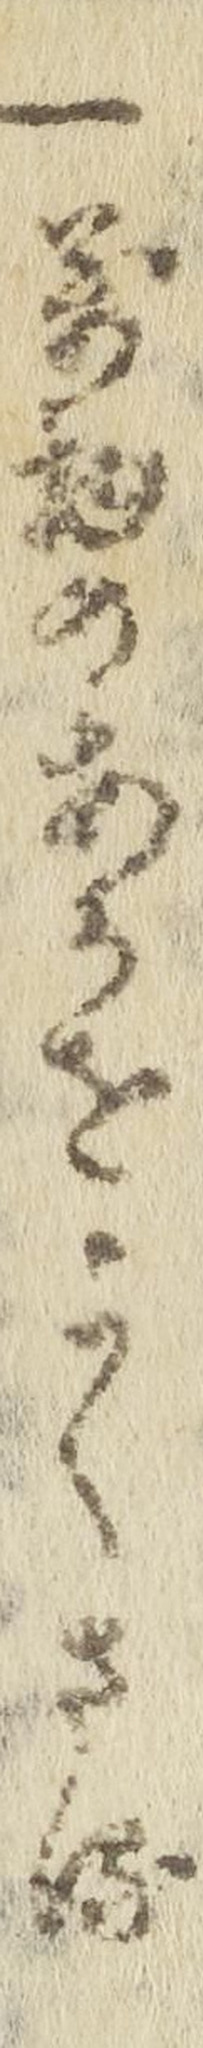一万物のあかをよくさる
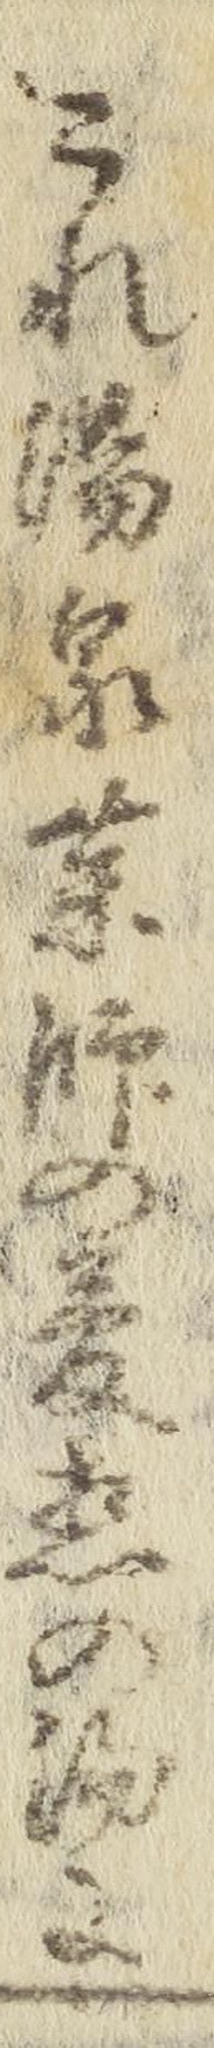これ湯泉薬師の夢想の湯に
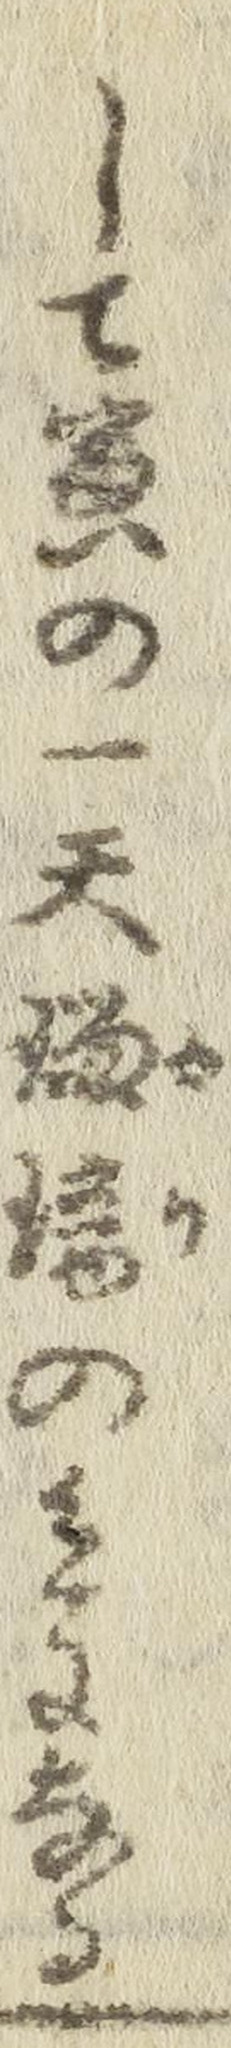して寅の一天瑠璃の色になる
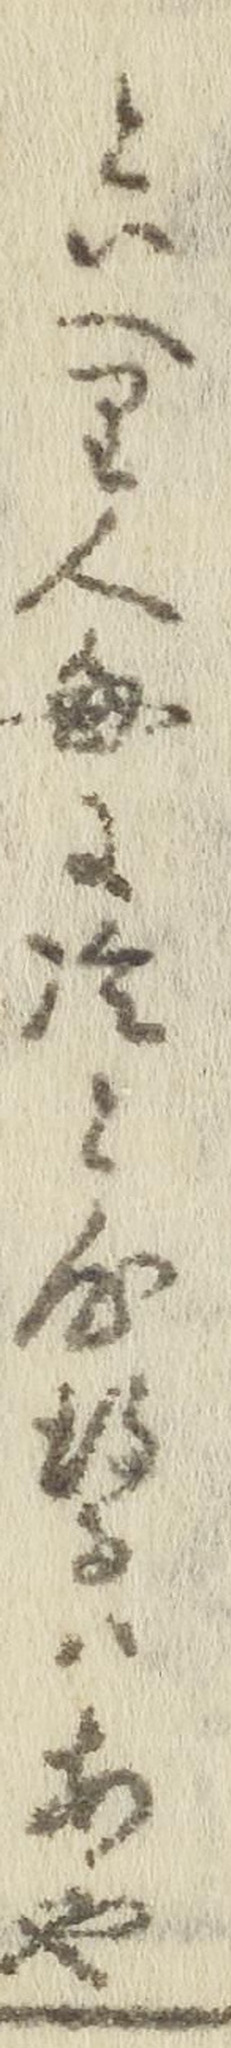といへり人毎に冷と心得るはあや
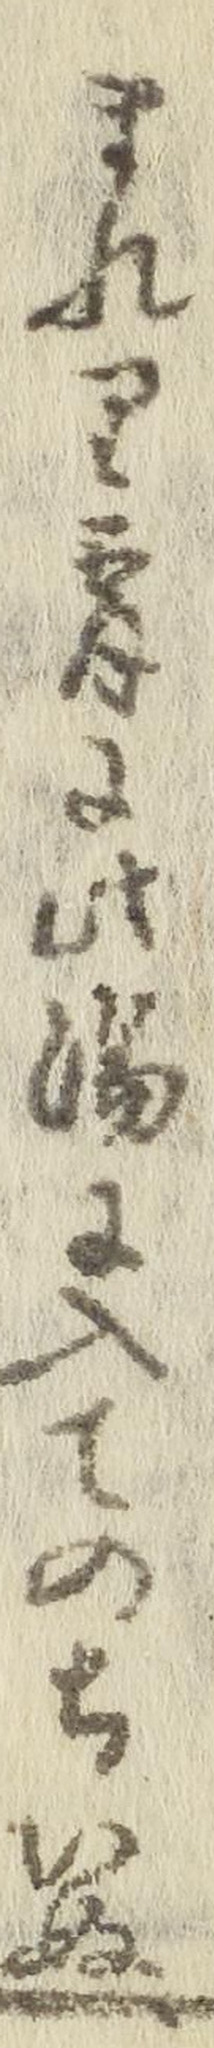まれり宵に此湯に入てのちいぬ
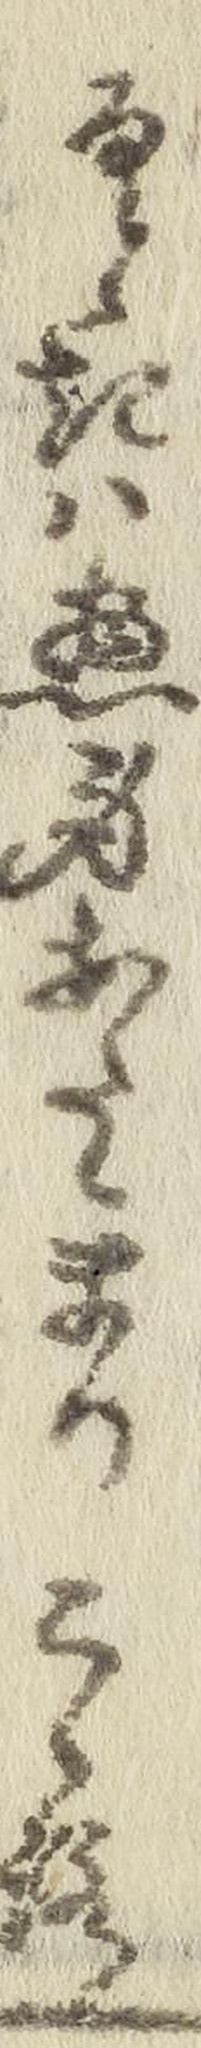るときは惣身あたゝまりこゝろ
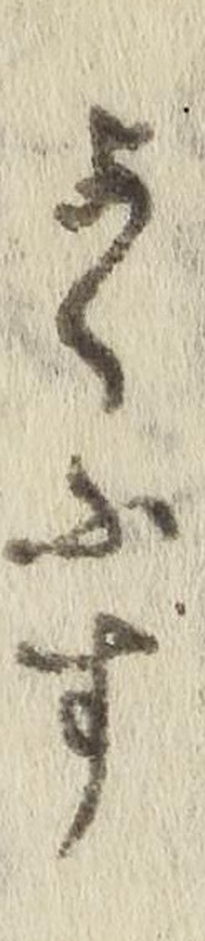よくふす
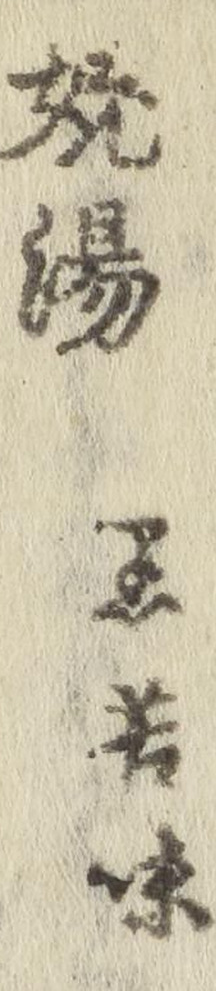姥湯黒苦味
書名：日光山中禅寺　温泉記　全
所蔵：東京大学地震研究所図書室 Earthquake Research Institute Library, The University of Tokyo, JAPAN
